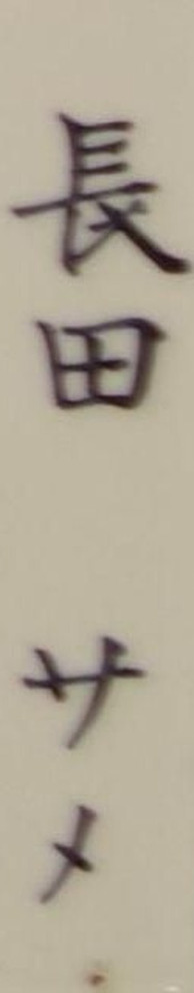長田サメ
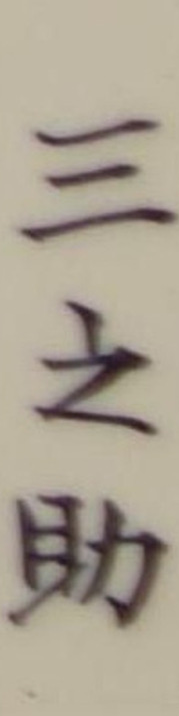三之助
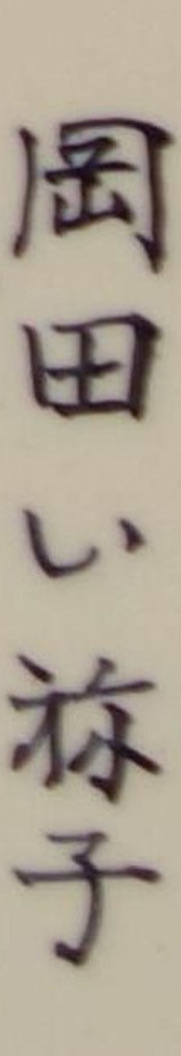岡田いね子
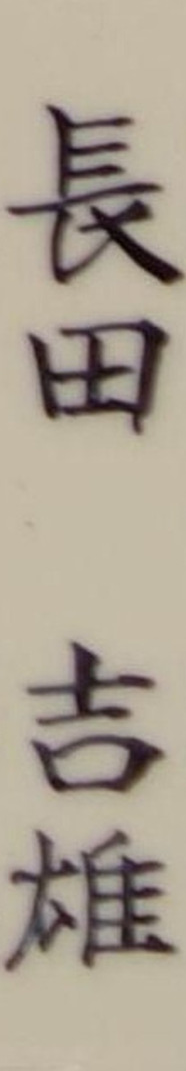長田吉雄
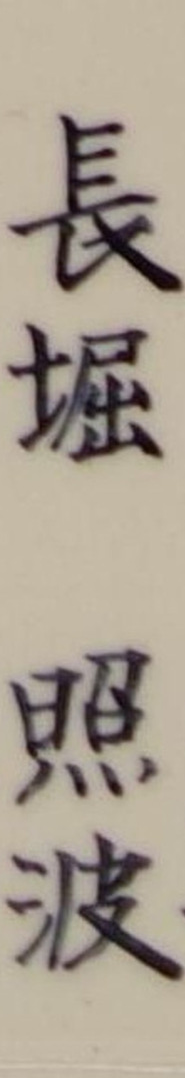長堀照波
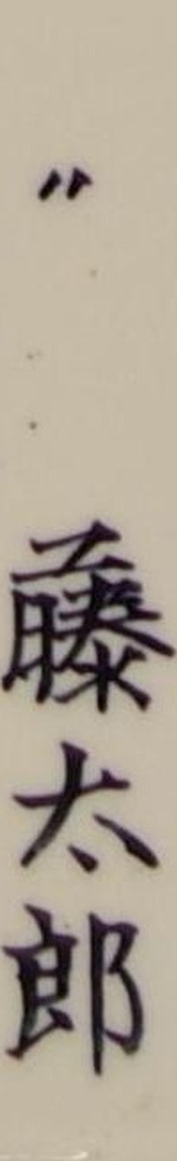藤太郎
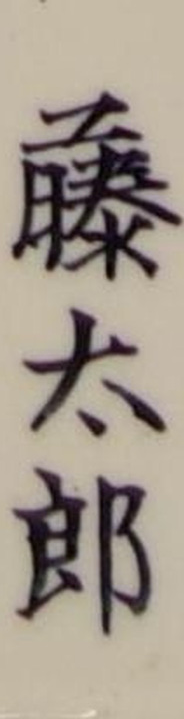藤太郎
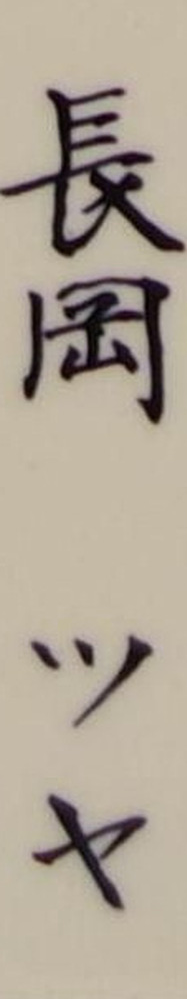長岡ツヤ
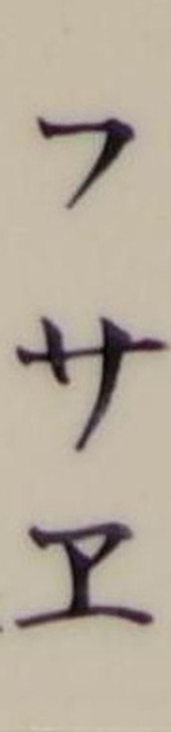フサエ
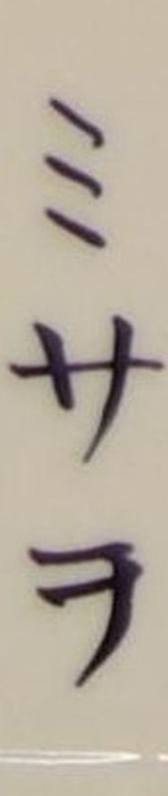ミサヲ
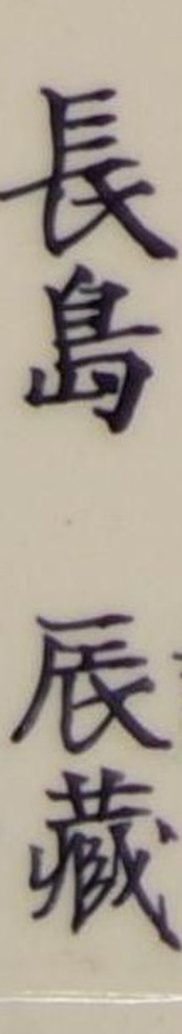長島辰蔵

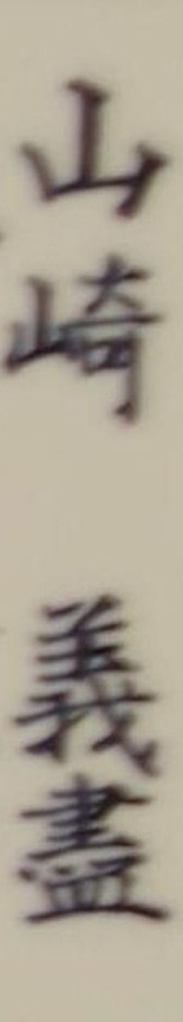山崎義盡
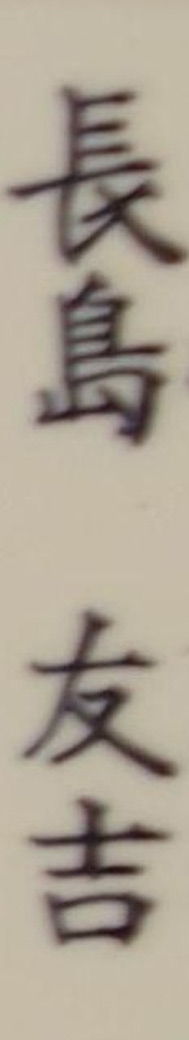長島友吉
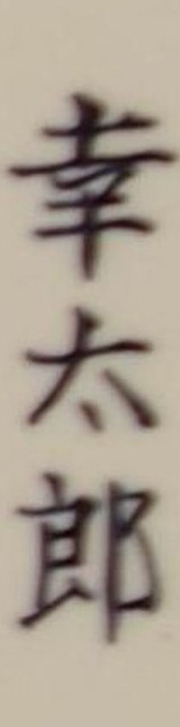幸太郎
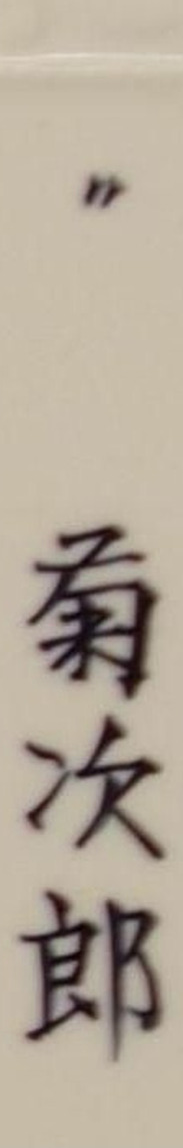菊次郎
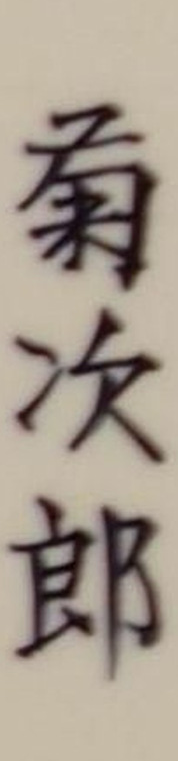菊次郎
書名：M~S
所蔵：高野山金剛峯寺
